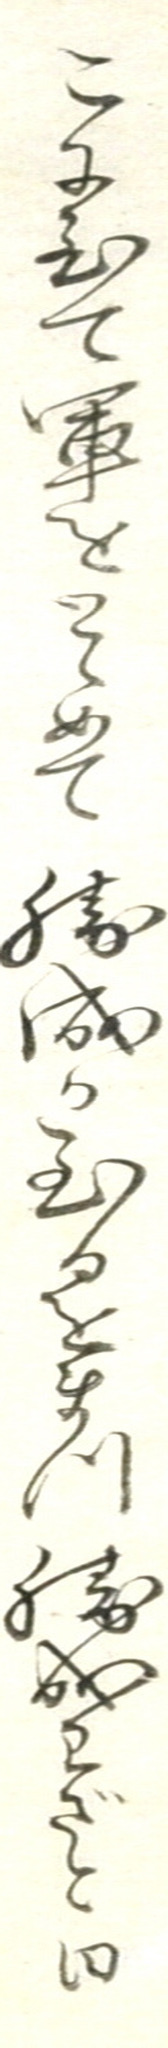こに至て軍をとゝめて勝成か至るをまつ勝成わざと日
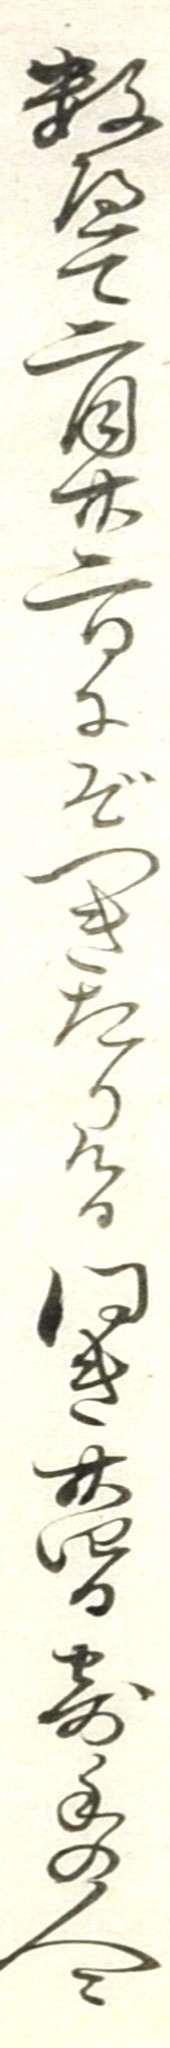数へて二月廿二日にぞつきたりける同き廿四日寄手の人々
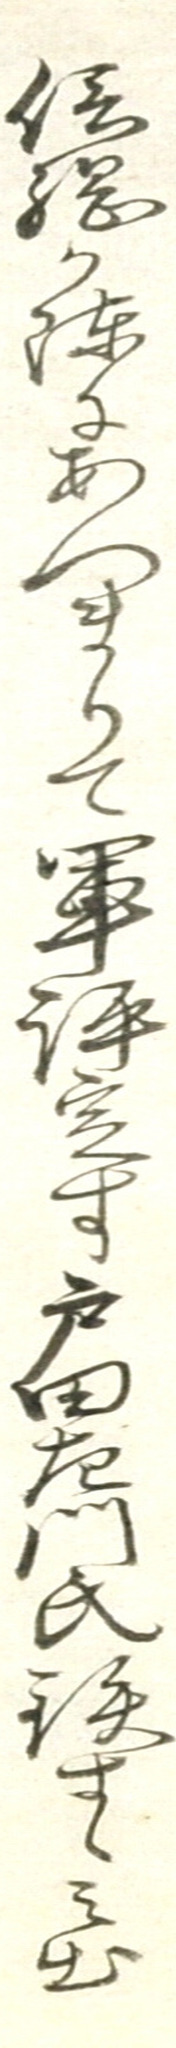信綱か陣にあつまりて軍評定す戸田左門氏鉄すゝみ出
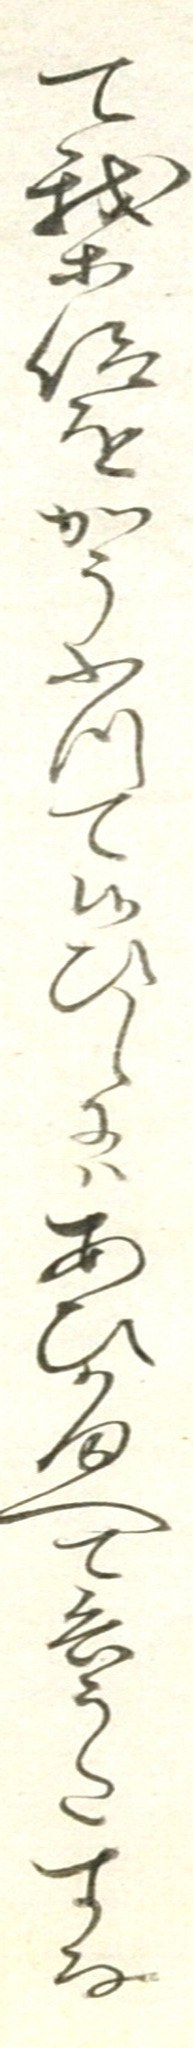て我等仰をかうふつて候ひしにはあひかまへて兵うたする
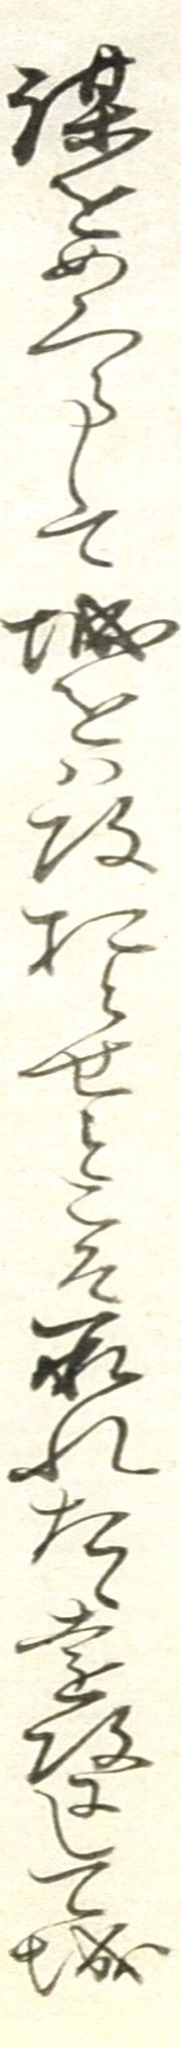謀をめくらして城をは攻おとせとこそ承れたゝ遠攻にして城
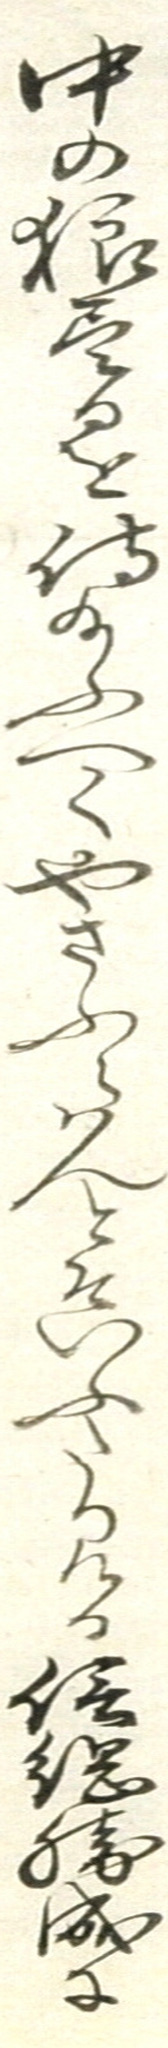中の粮尽るを待給ふへくやさふらはんとそいふたりける信綱勝成に
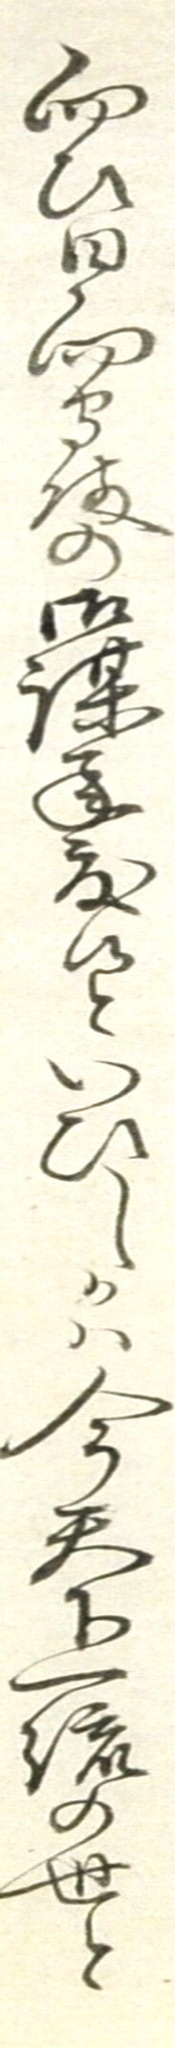向ひ日向守殿の御謀承度候といひしかは今天下一流の世と
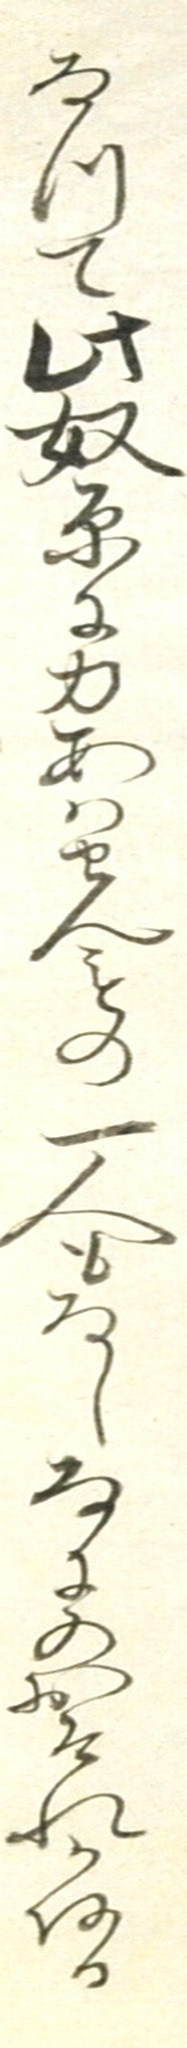なつて此奴原に力あはせんもの一人もなしなにのおそれかある
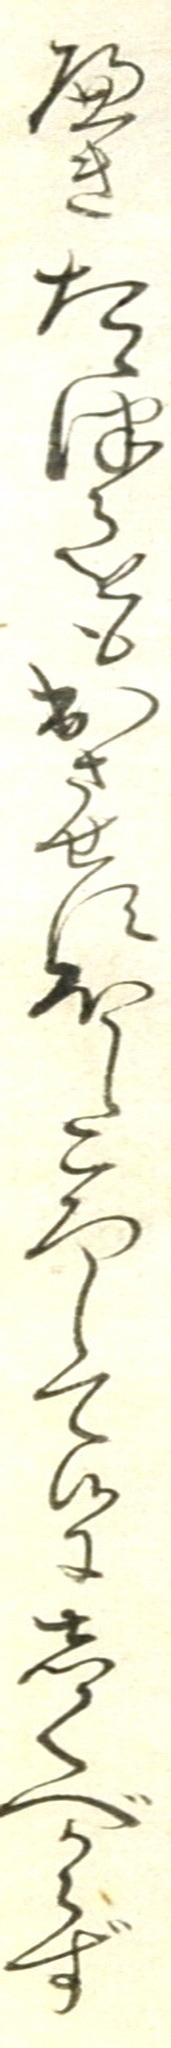へきたゝつらをも出させすほしころして候にしくべからず

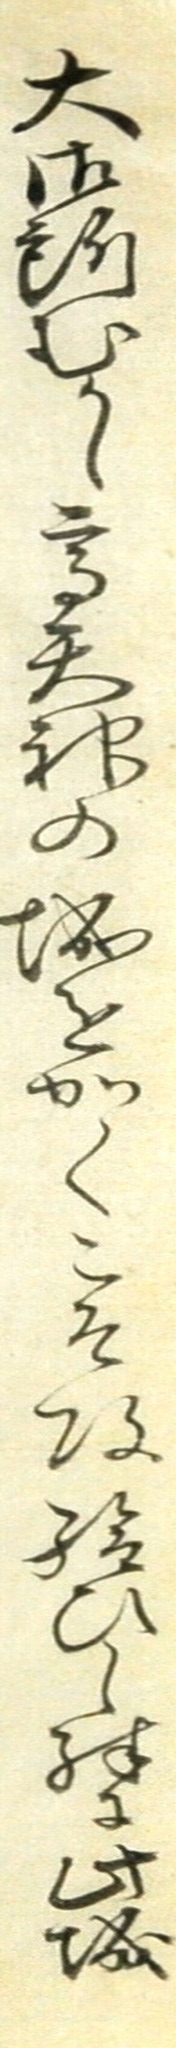大御所むかし高天神の城をかくこそ攻給ひし殊に此城
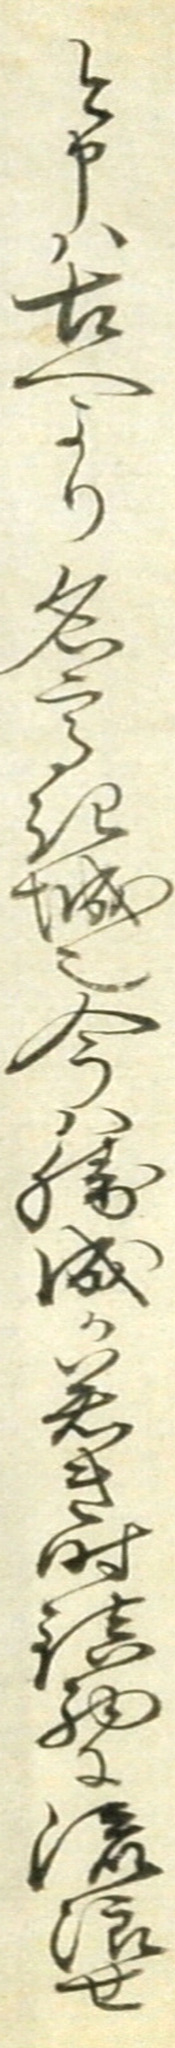と申は古へより名高き城也今は勝成か若き時鎮西に流浪せ
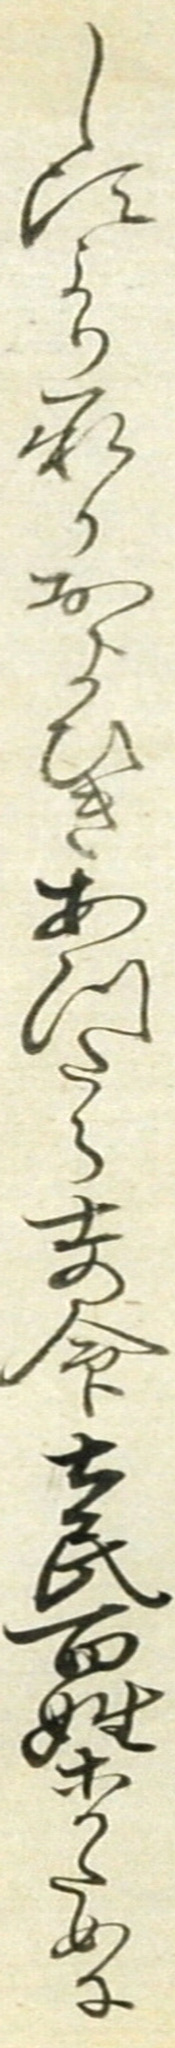し頃より承りおよひきあつたら士の命土民百姓等かために
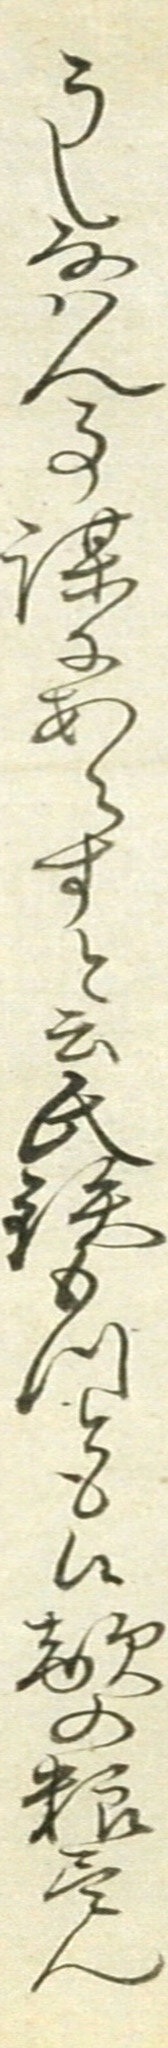うしなはん事謀にあらすと云氏鉄もつとも候敵の粮尽ん
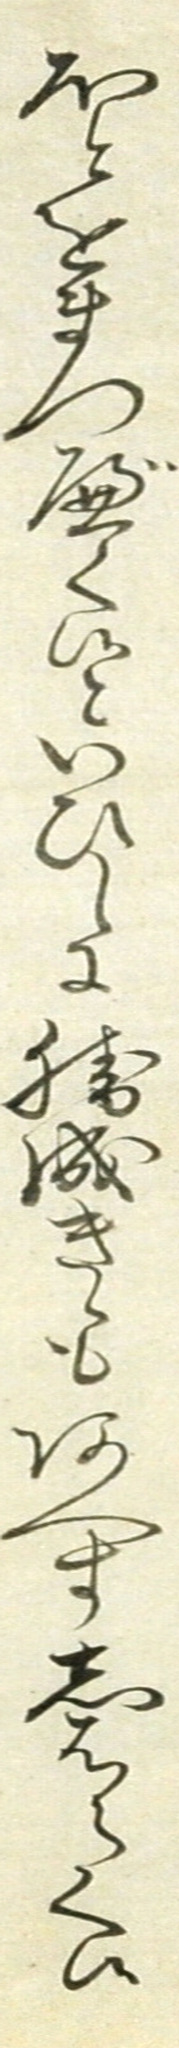ほとをまつべく候といひしに勝成きゝもあへすしはらく候
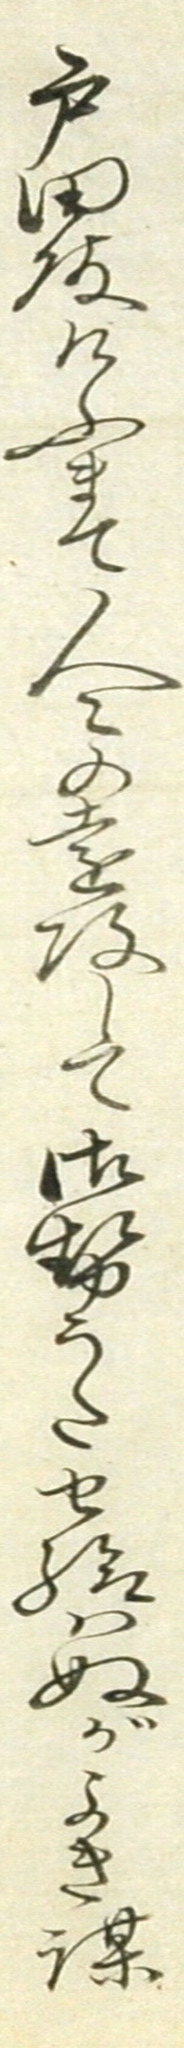戸田殿けふまて人々の遠攻して御勢うたせ給はぬがよき謀
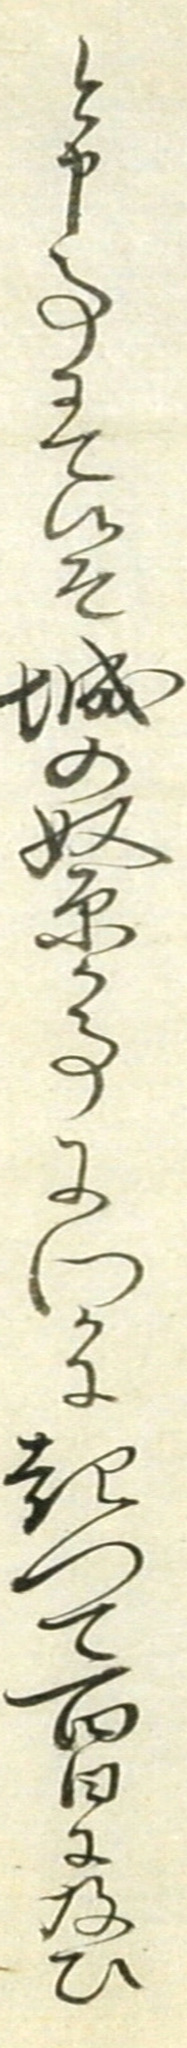と申事にて候そ城の奴原か事にわかに起つて百日に及ひ
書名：藩翰譜（二・三）
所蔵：伊那市立高遠町図書館・合同会社AMANE
